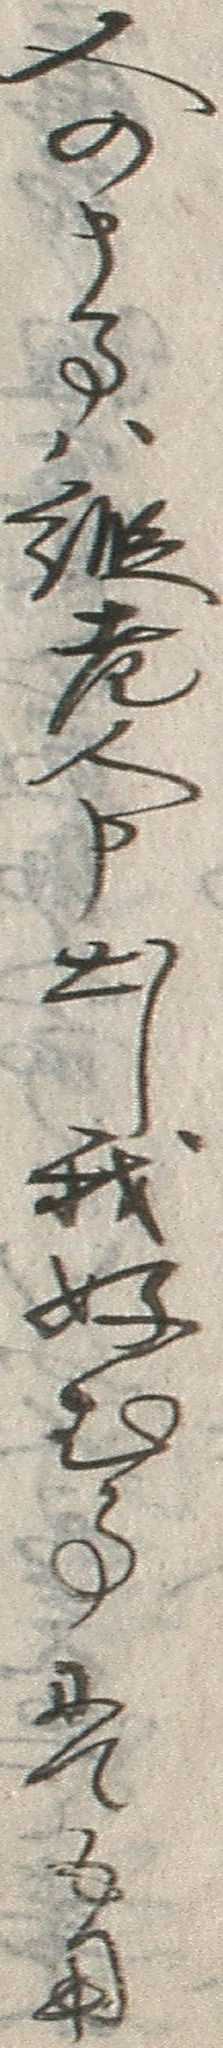人の申事は縦老人申出し我好む事にても用
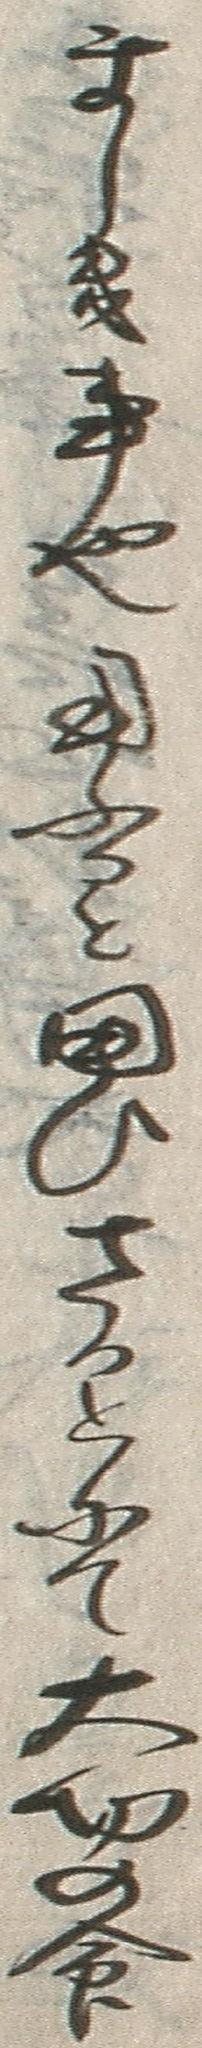ましき事也用ふると用ひさるとにて大切の命

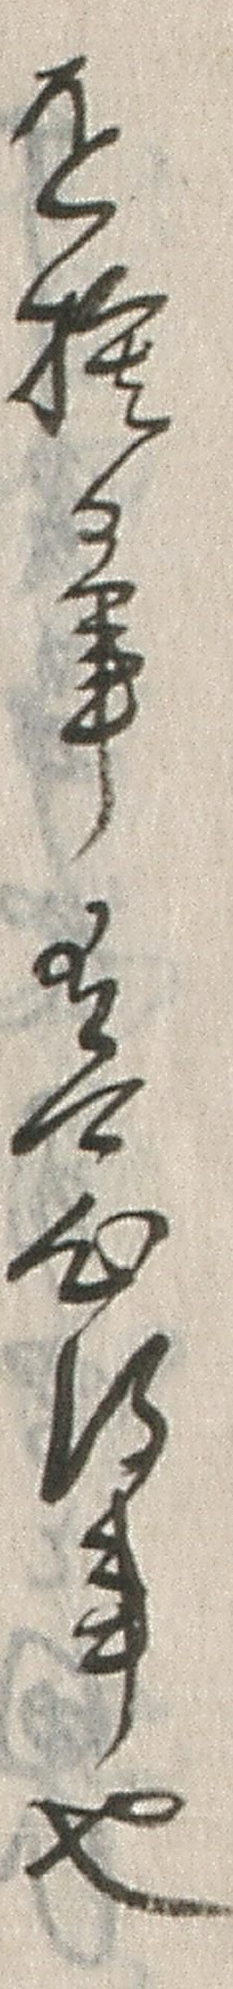を捨る事有可心得事也
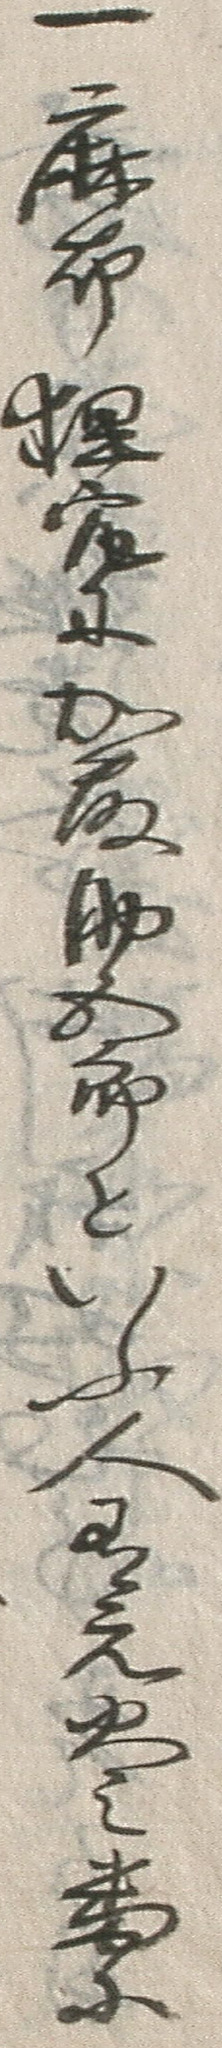一麻布狸穴に加藤助五郎といふ人有元火之番に
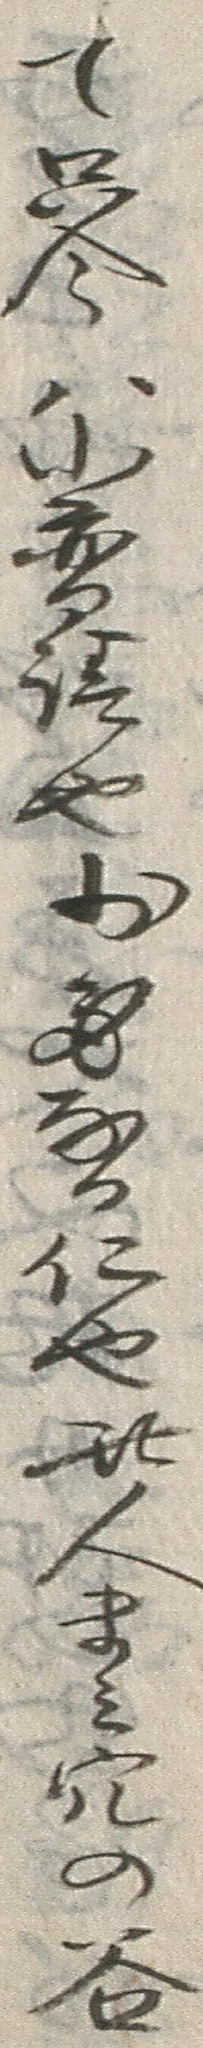て只今は小普請也少身なる仁也此人まみ穴の谷
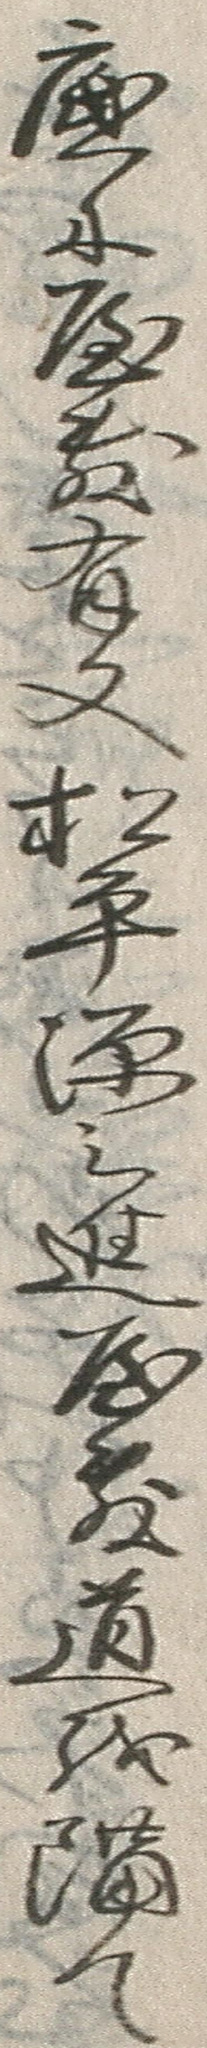底に屋敷有又松平源之進屋敷道を隔て
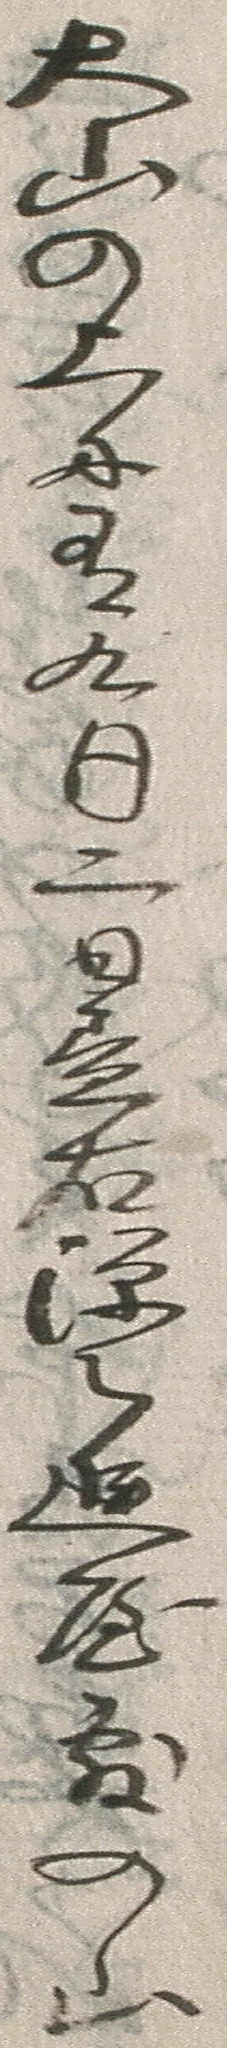大山の上に有九月二日昼右源之進屋敷の山
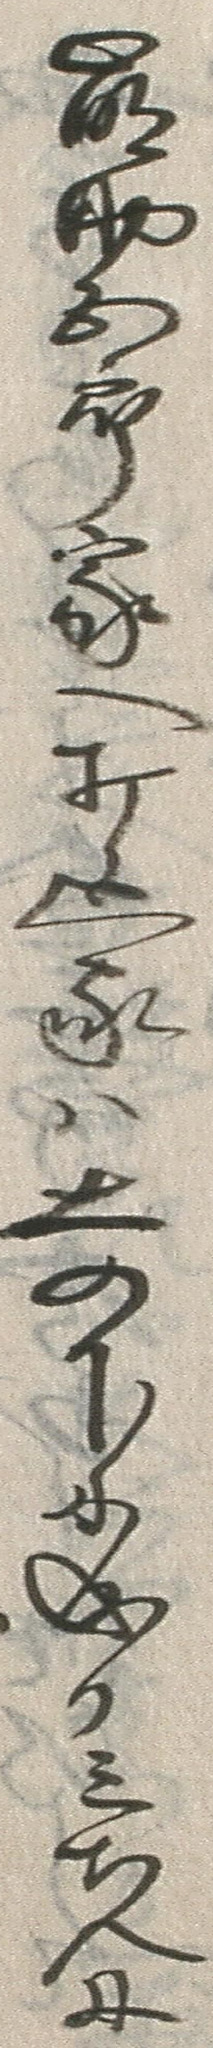崩助五郎家へ打込家は土の下に成りみちんに
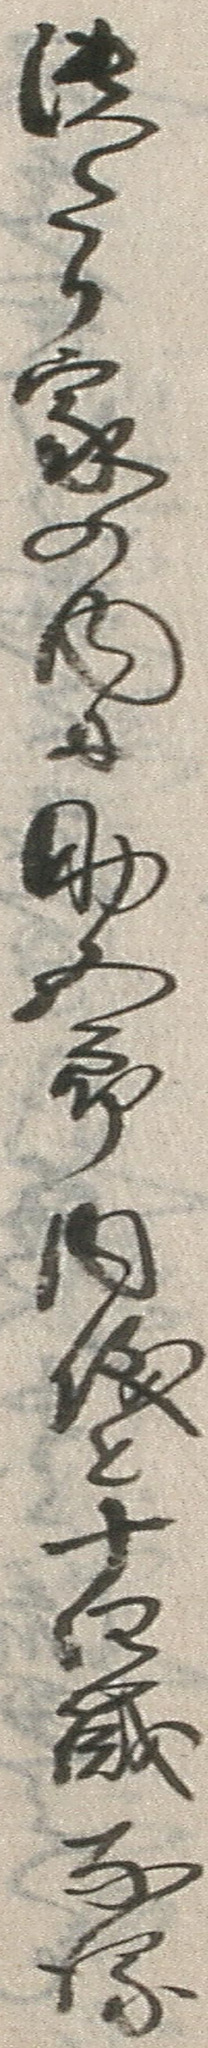潰たり家の内に助五郎内儀と十四歳なる
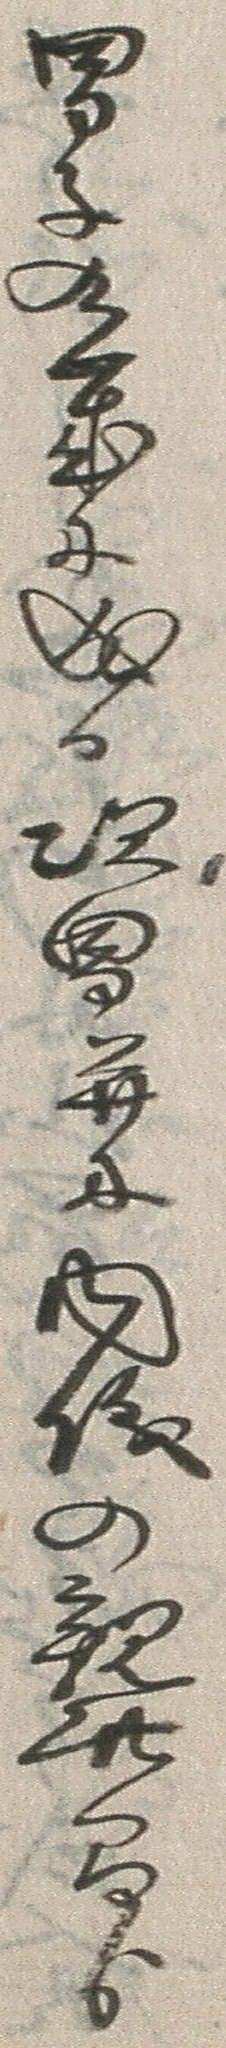男子九歳に成る次男并に内儀の親此間ゟ
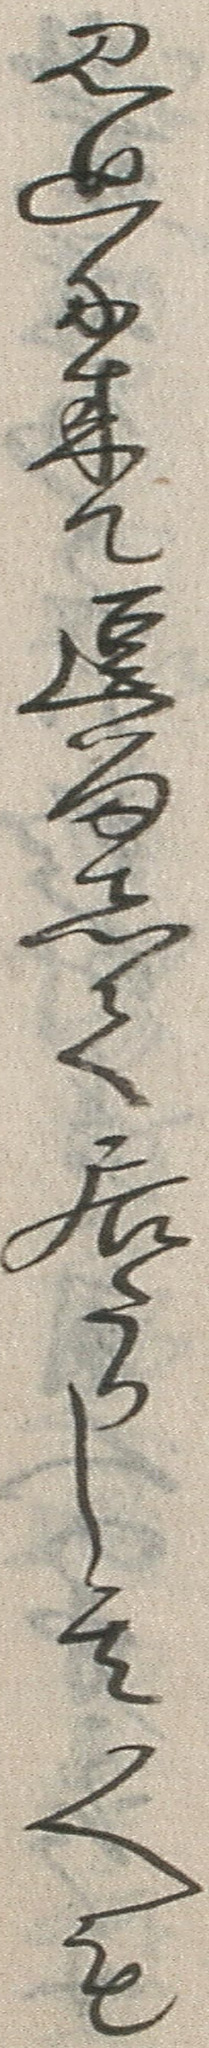見廻に来て逗留して居たりし其人も
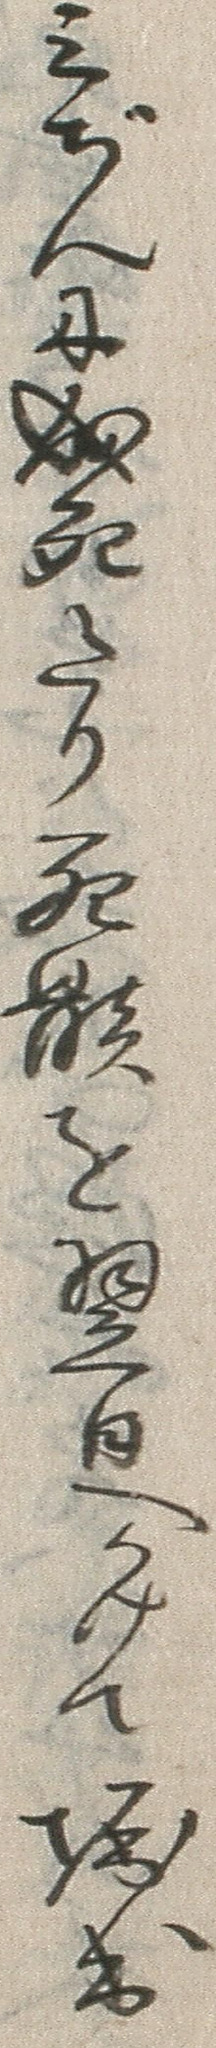みぢんに成死たり死骸を翌日へかけて堀出
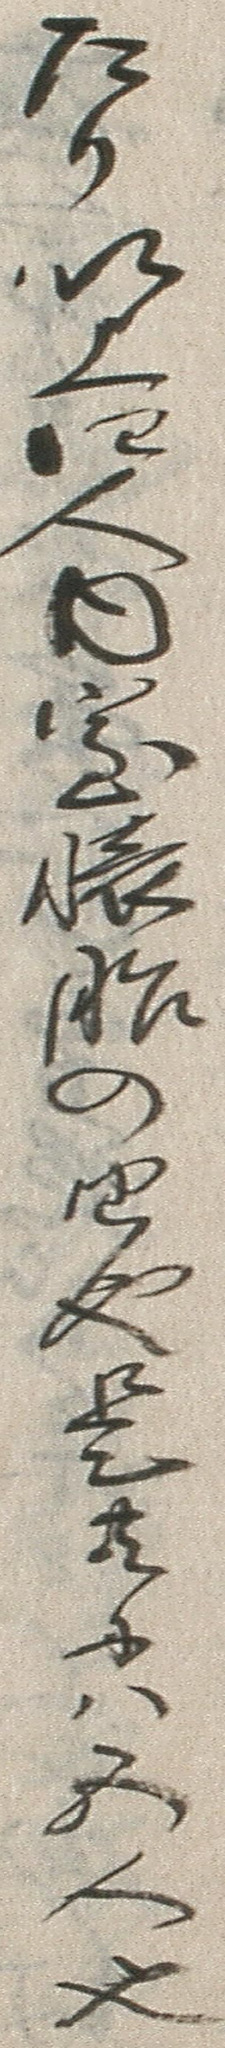たり以上四人内室懐胎の由也是共には五人也
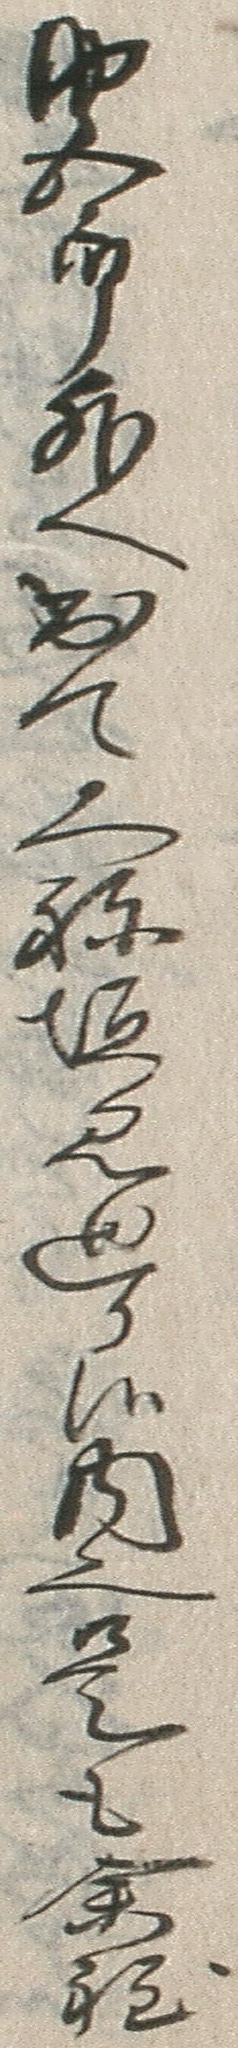助五郎外へ出てくね垣見廻り候内也是も余程
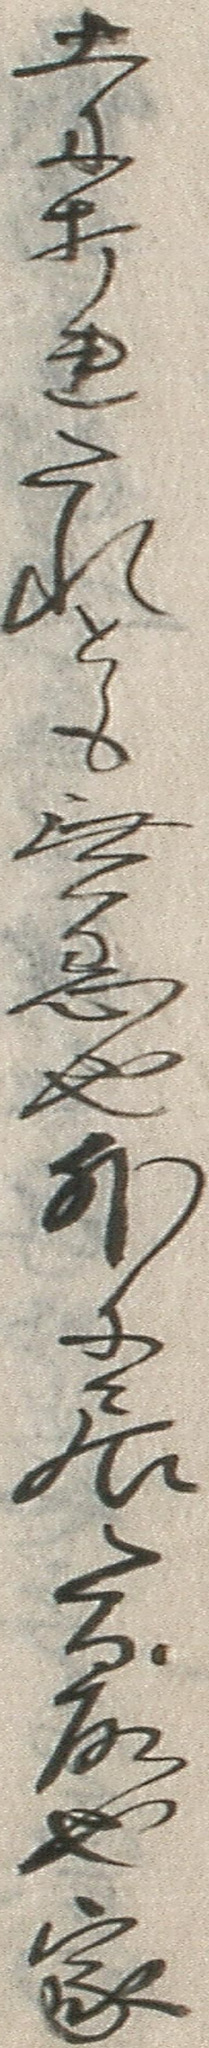土に打れたれとも無恙也外に居たる故也家
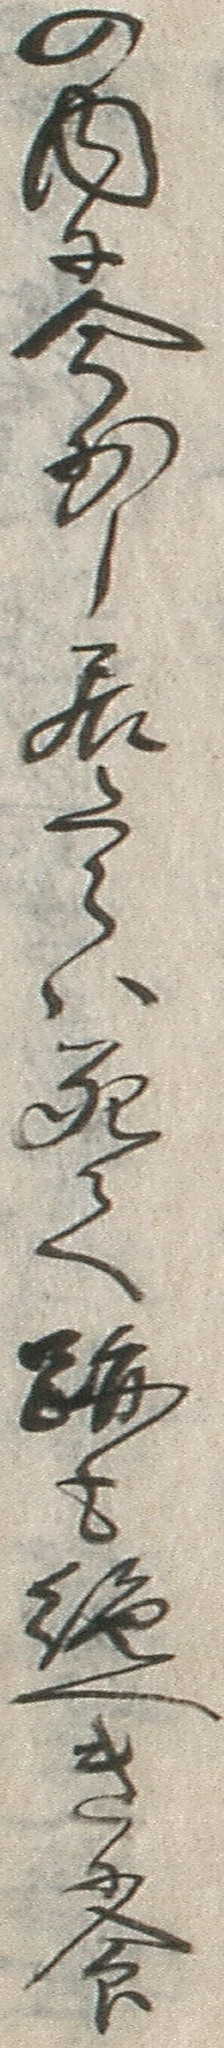の内に今少し居たらは死て跡も絶へきに命
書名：享保十三年江戸洪水記
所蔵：東京大学地震研究所図書室 Earthquake Research Institute Library, The University of Tokyo, JAPAN
